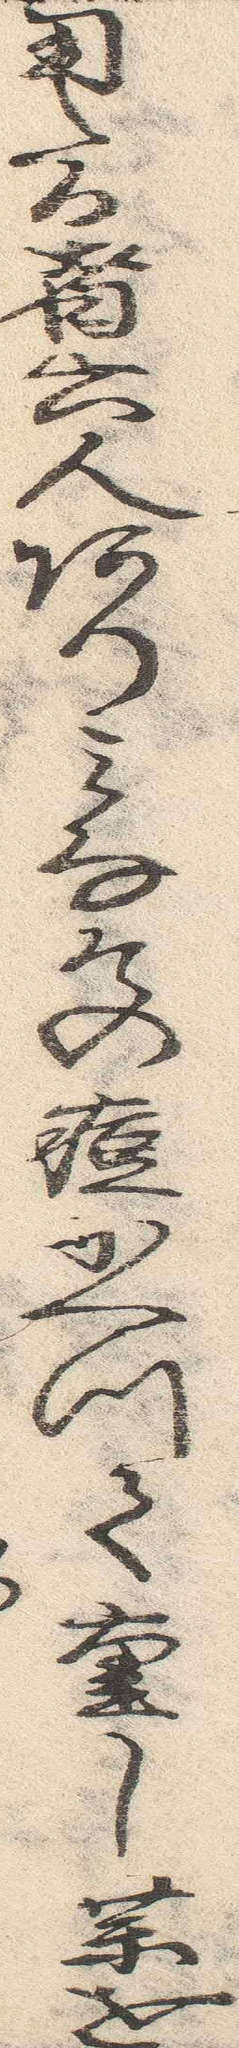用たる者六人ありみなその痘かへつて重し薬を
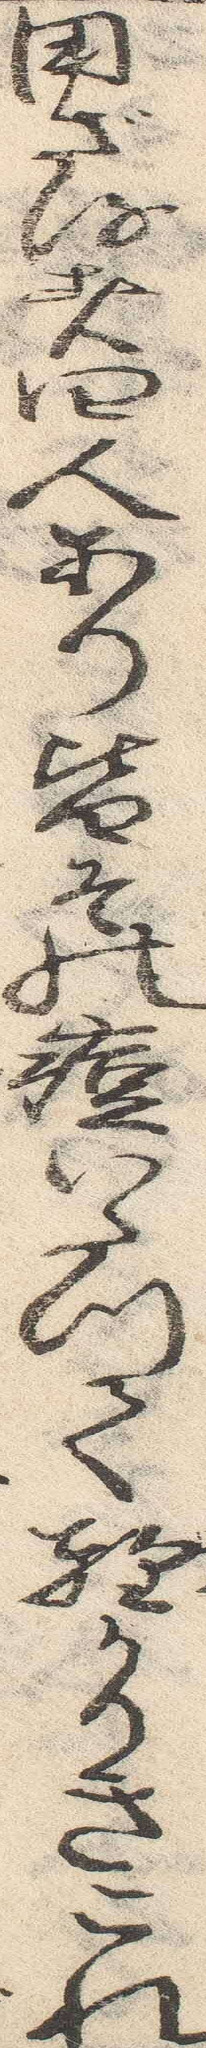用ざる者四人あり皆その痘いたつて軽かりきこれ
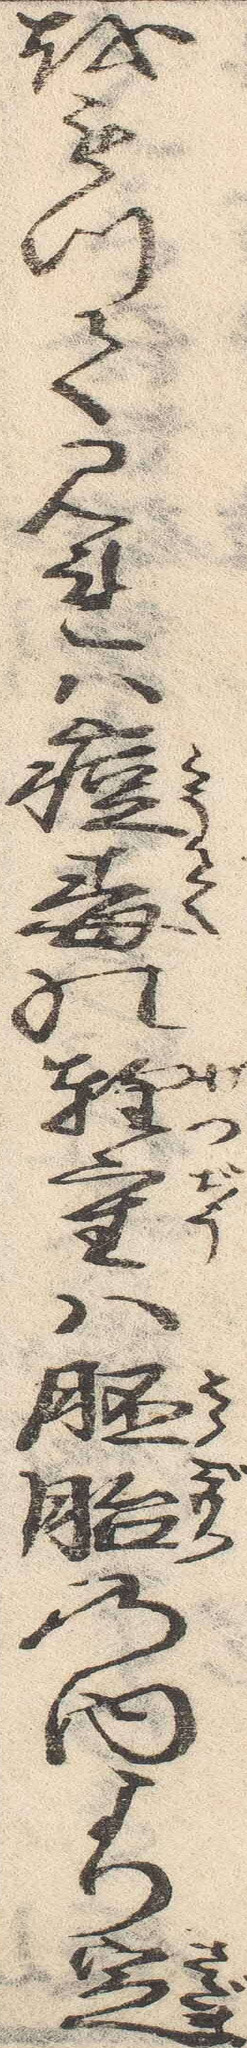をもつて見れは痘毒の軽重は胚胎の内より定
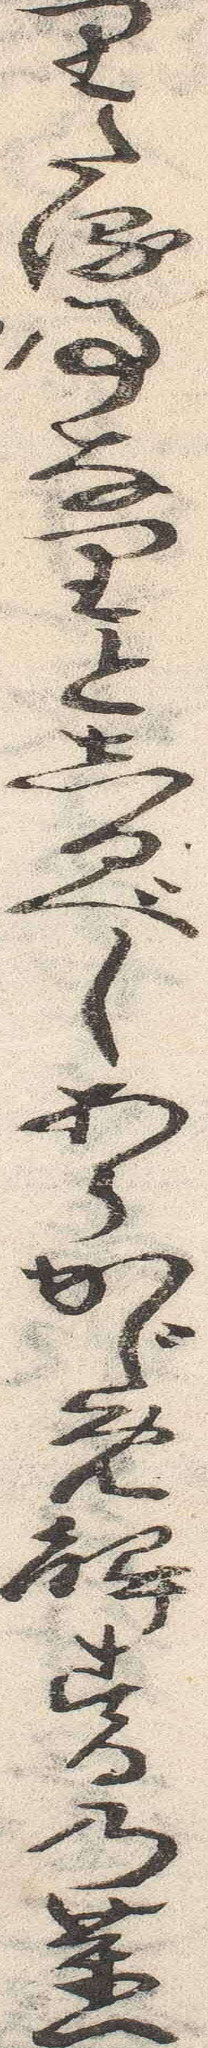りたる事なりとしるべしあらかじめ解するの薬
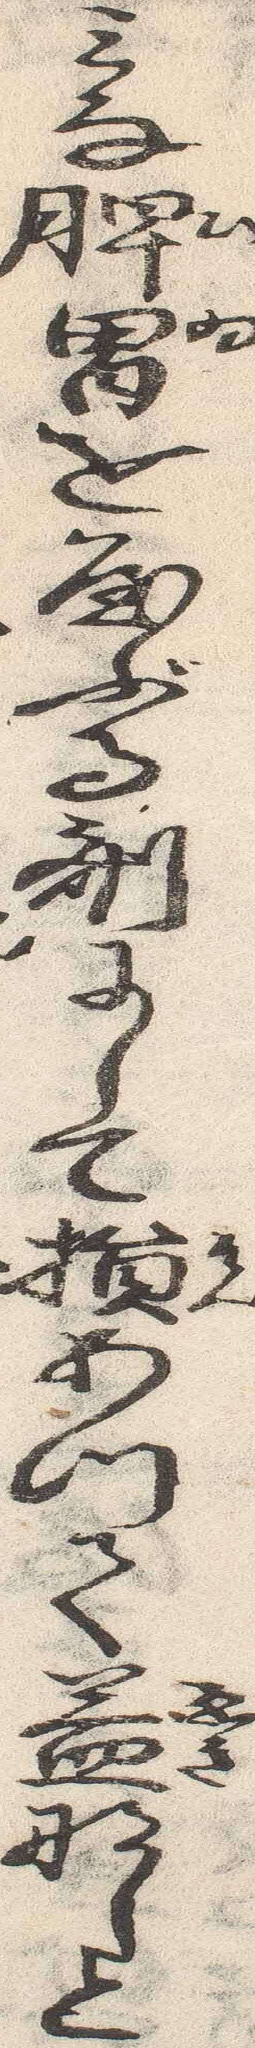みな脾胃をやぶる剤にして損あつて益なしと
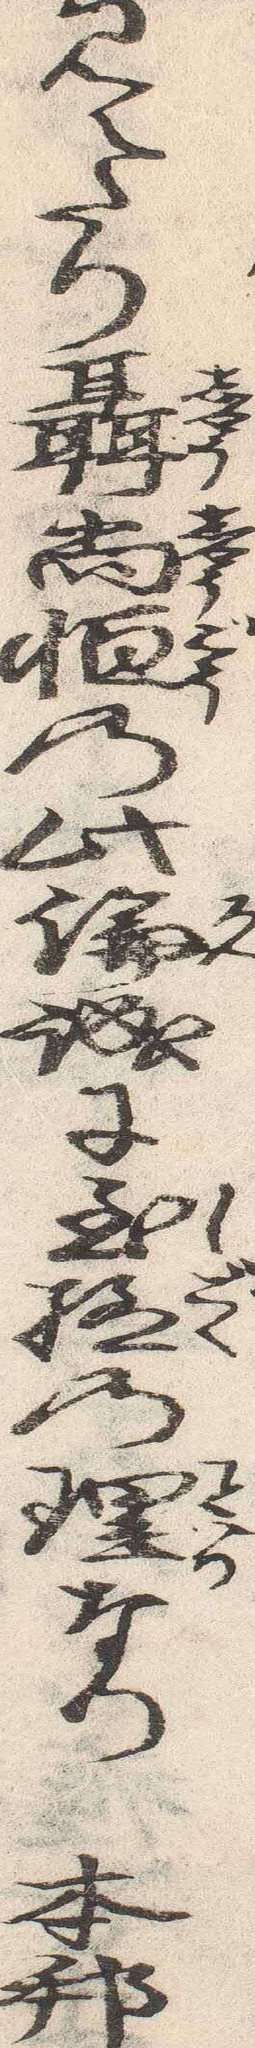見えたり聶尚恒の此論議に至極の理なり本邦
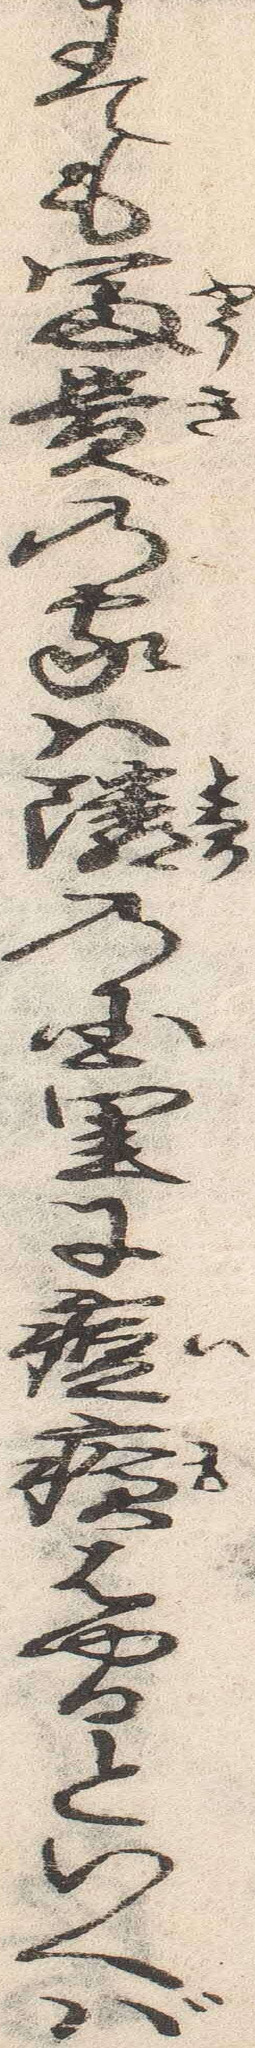にても富貴の家は隣の国里に痘瘡はやるといへば
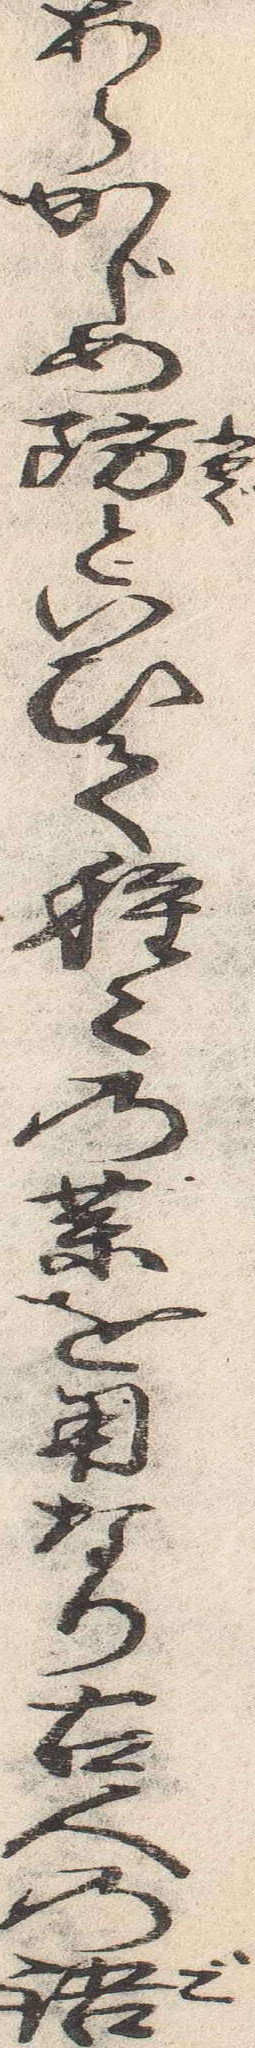あらかじめ防といひて種々の薬を用なり古人の語
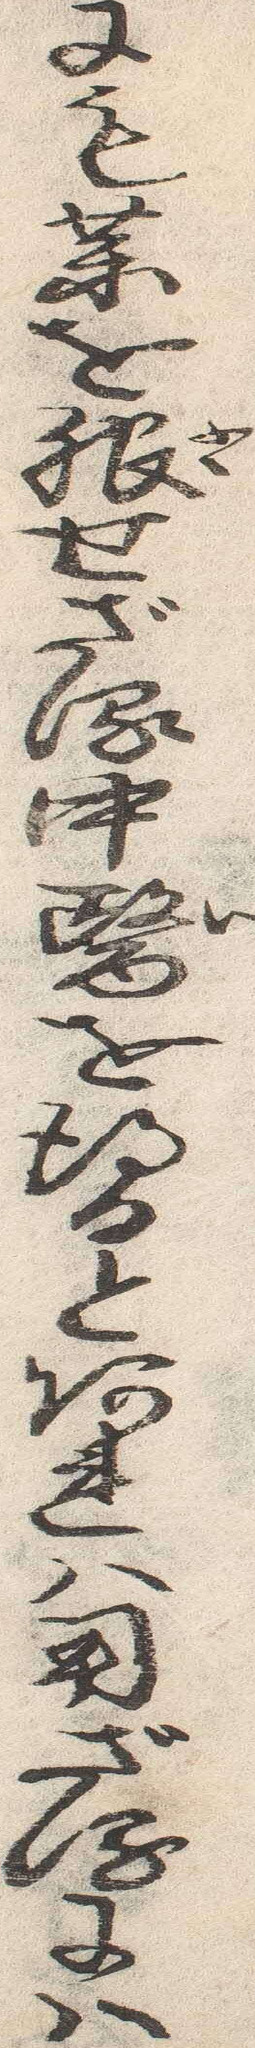にも薬を服せざる中医を得るとあれは用ざるには
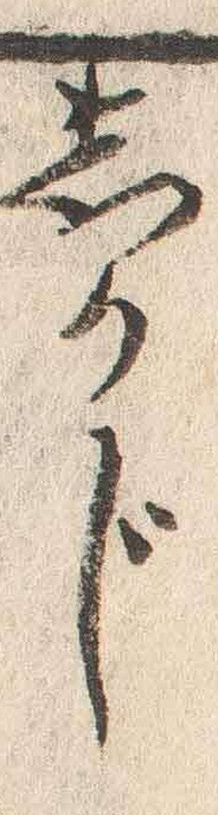しかじ
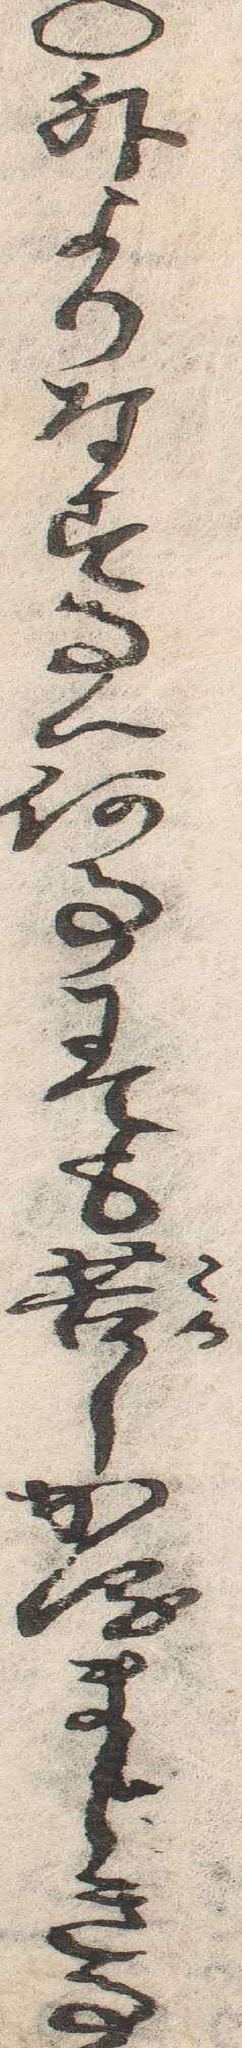○外よりなす事は何事にても苦しかるまじき事
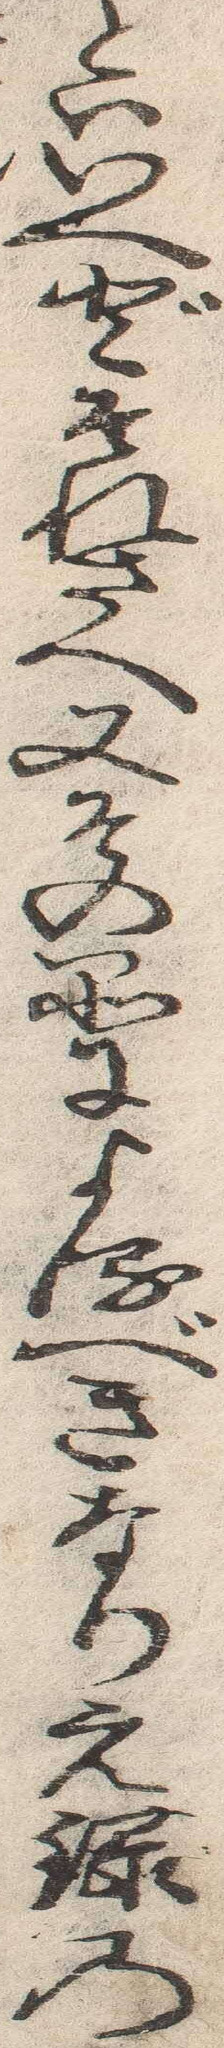とはいへどそれさへ又その品によるべきなり元禄の
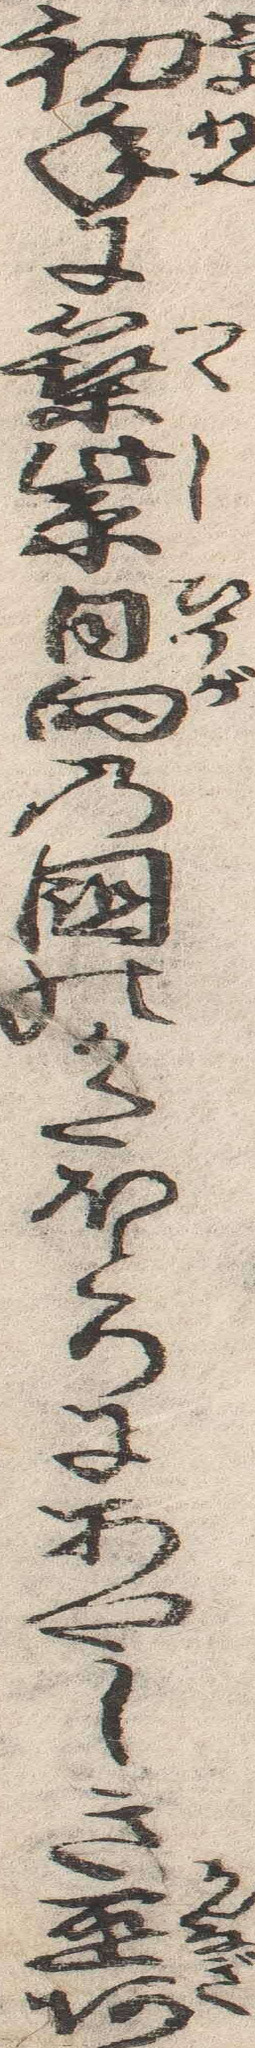初年に築紫日向の国のかたほとりにあやしき巫あ
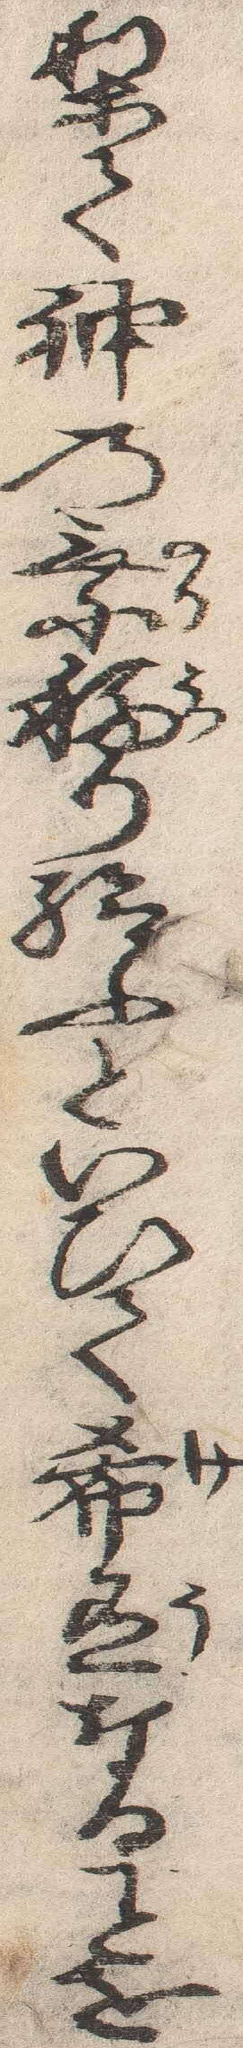りて神の乗移り給ふといひて希有なることを

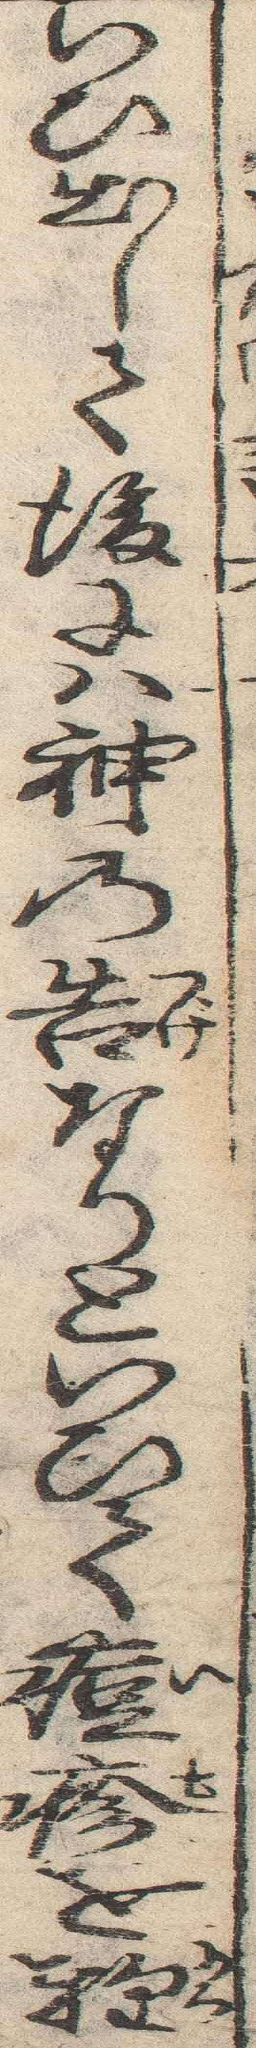いひ出して後には神の告なりといひて痘疹を軽
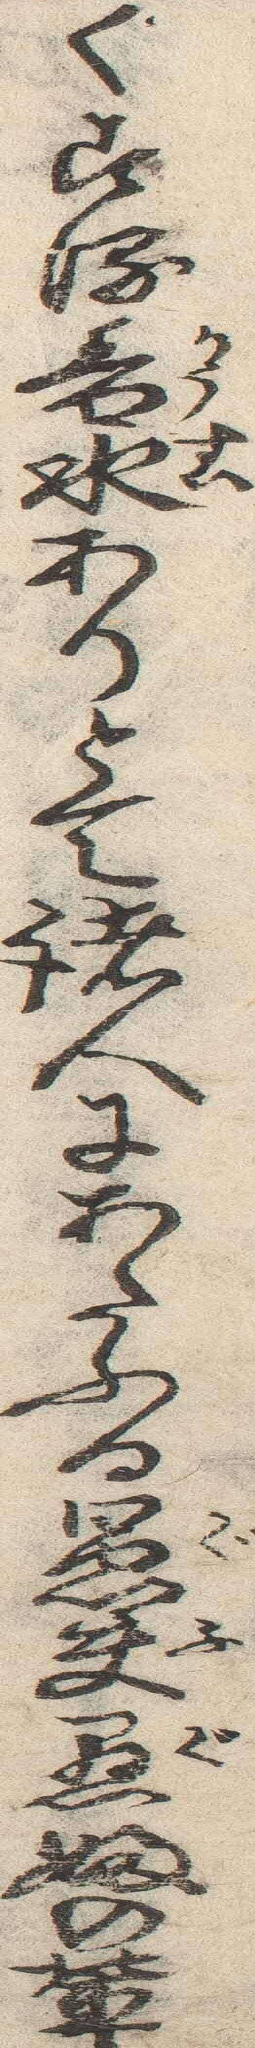くする香水ありとて諸人にあたふる愚夫愚婦の輩
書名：小児必用養育草
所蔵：東京学芸大学附属図書館 国文学研究資料館
